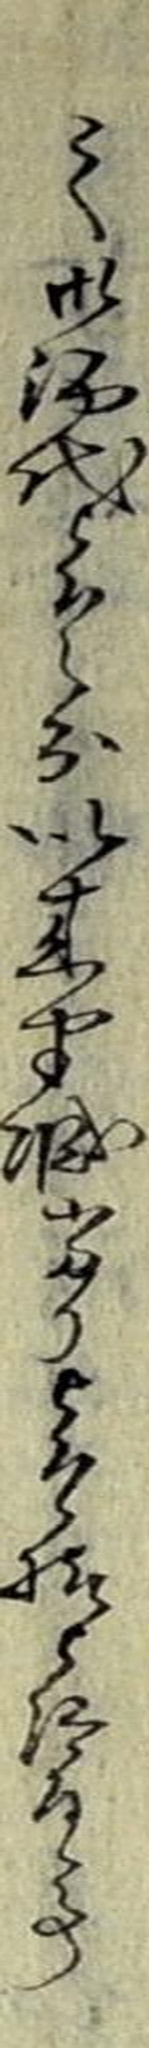之御酒代被下候分以来半減当り被下候様被仰付候事
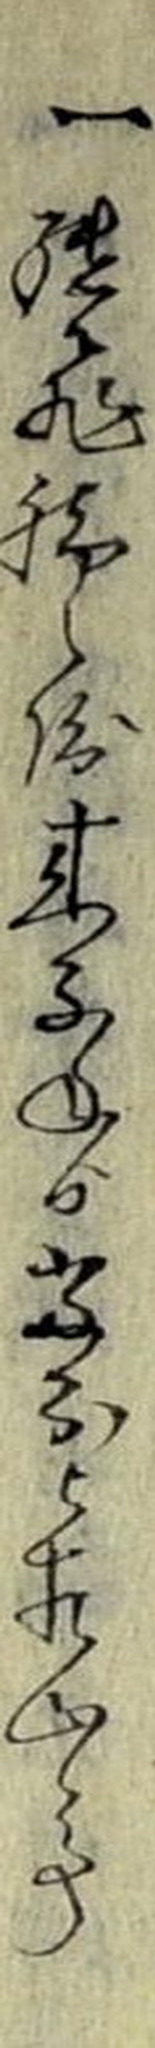一継飛脚之儀来子年ゟ当分被相止候事
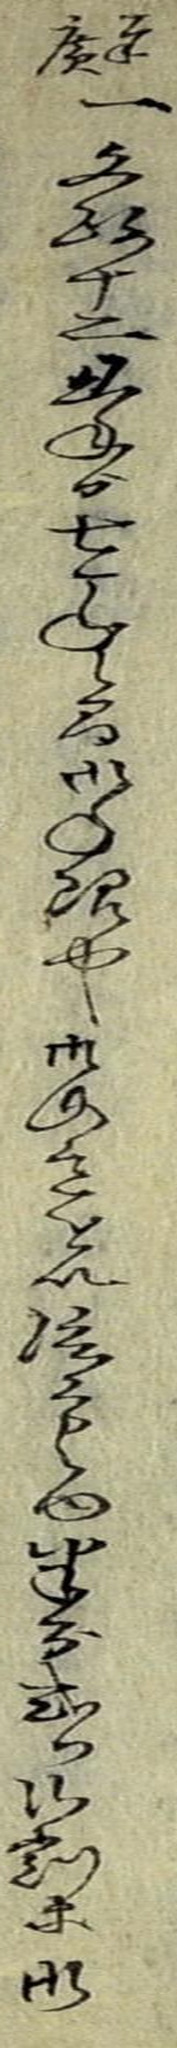奉広一文政十二丑年ゟ七ヶ年之間御年限中御趣意を以渡方之内半分或は弐割未御
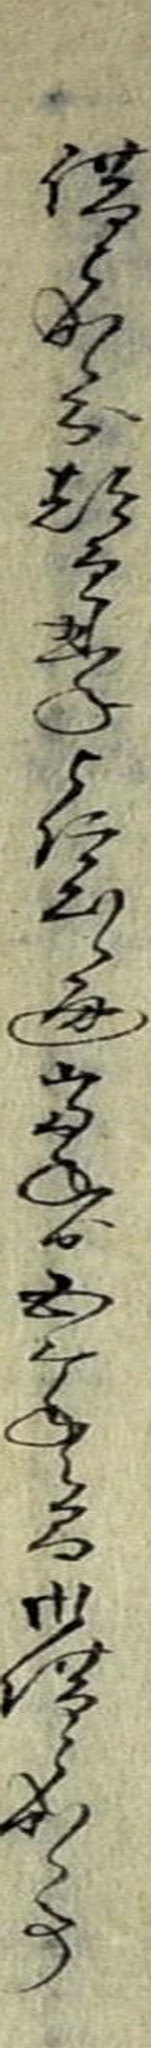借被成候分都而丑年被仰出候通当年ゟ五ヶ年之間御借被成候事
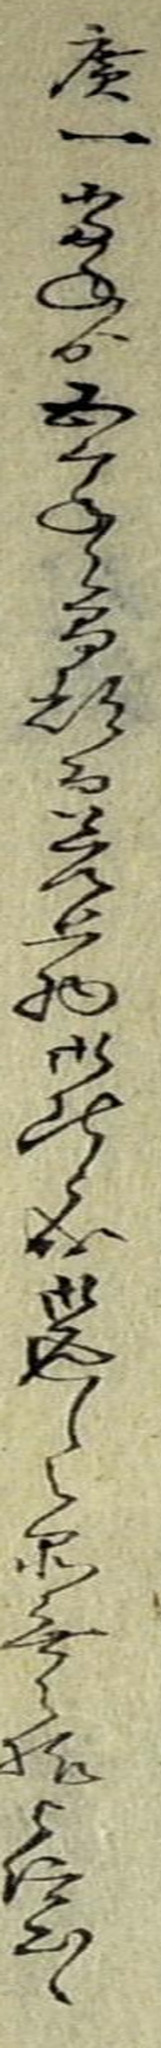広一当年ゟ五ヶ年之間都而差上物御断被成御返之品無之様被仰出候
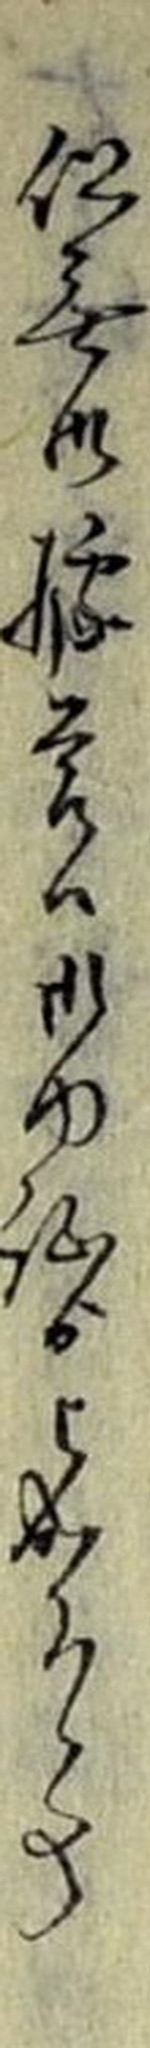但無御拠節は御内証ゟ被成下候事
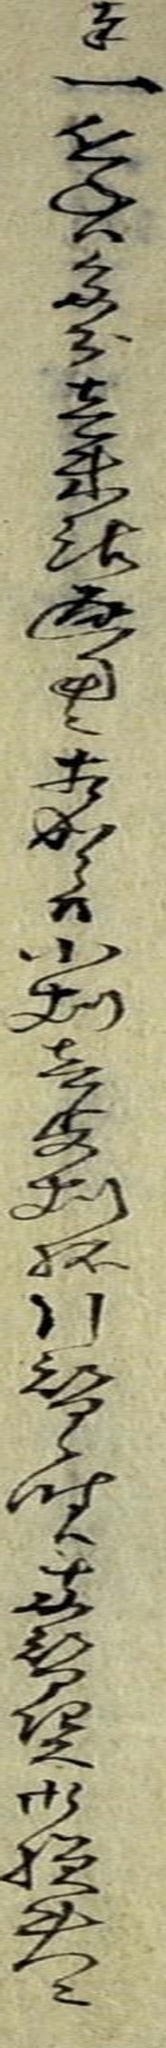奉一近年は多分壱朱銀通用に相成に付小判壱歩判抔引替之時は両替賃御損失に
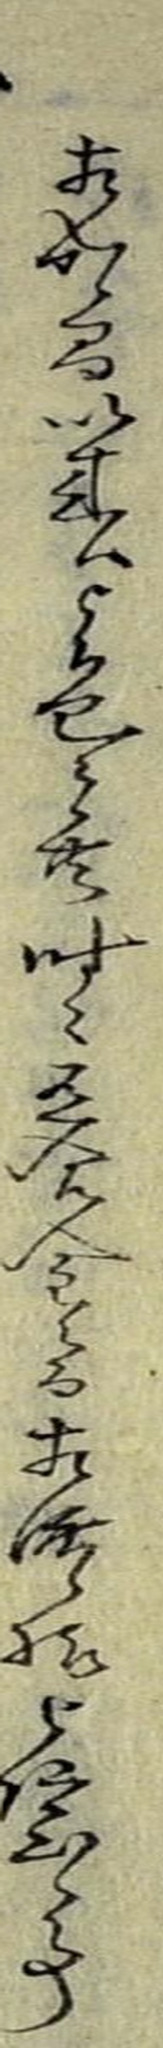相成候間以来は被下包に候共時々有合金に而相済候様被仰出候事
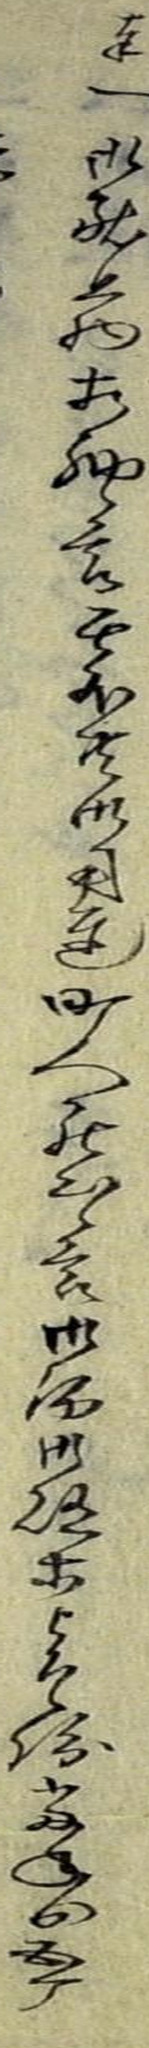奉一御献上物相納候節其外共御用達町人罷出候節御酒御賄等被下候儀当年ゟ五ヶ
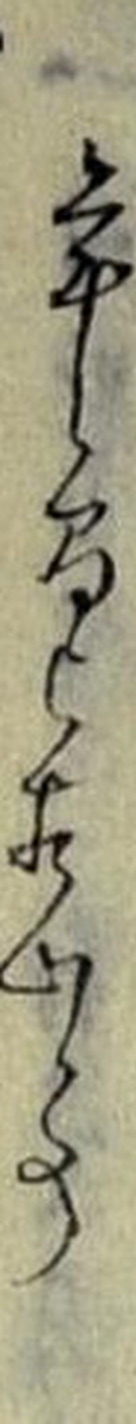年之間被相止候事
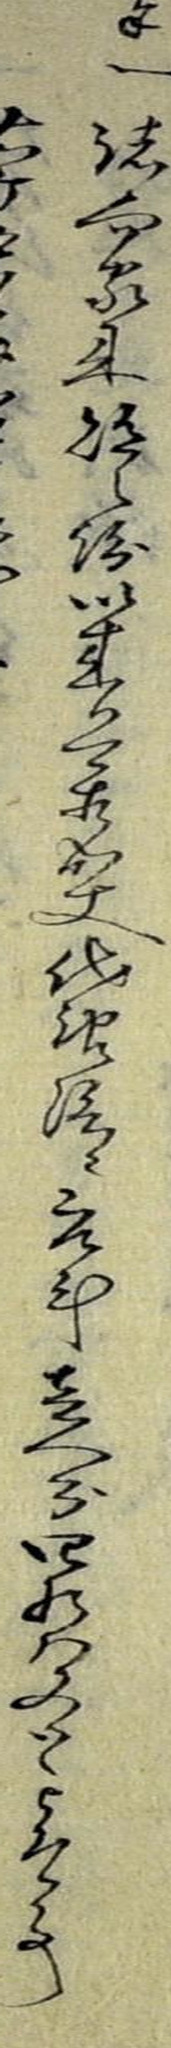奉一諸向家来賄之儀以来は可相成丈代銀渡に取斗壱人分四拾八文つヽ被下候事
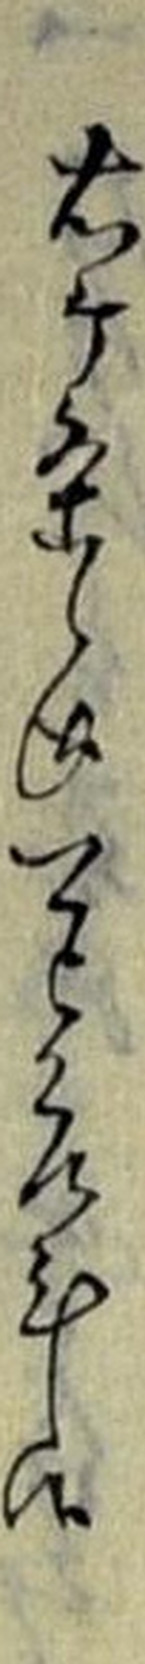右ヶ条之趣可被取斗候
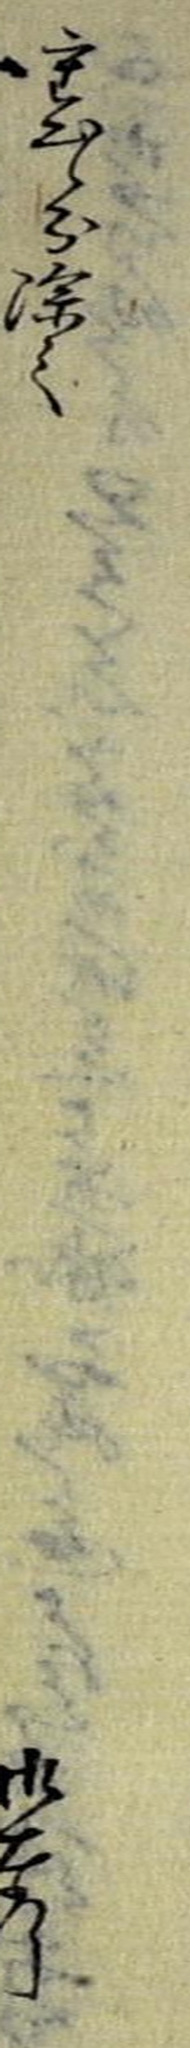重出之分除之御奉行
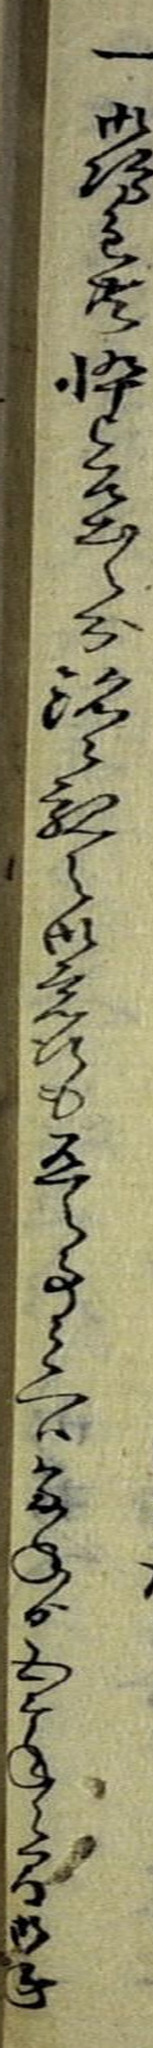一御坊主共忰被召出候分銘々親之御充行も有之事に候へは当年ゟ五ヶ年之間御年
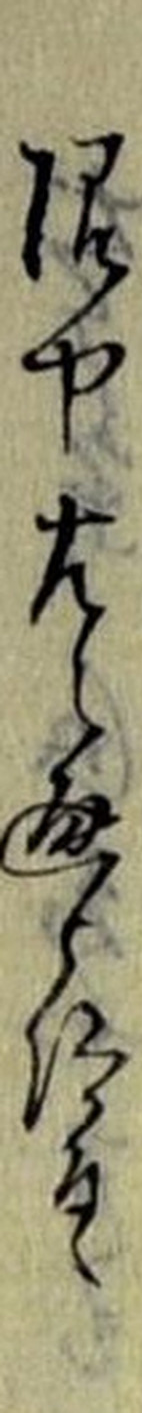限中左之通被仰付候
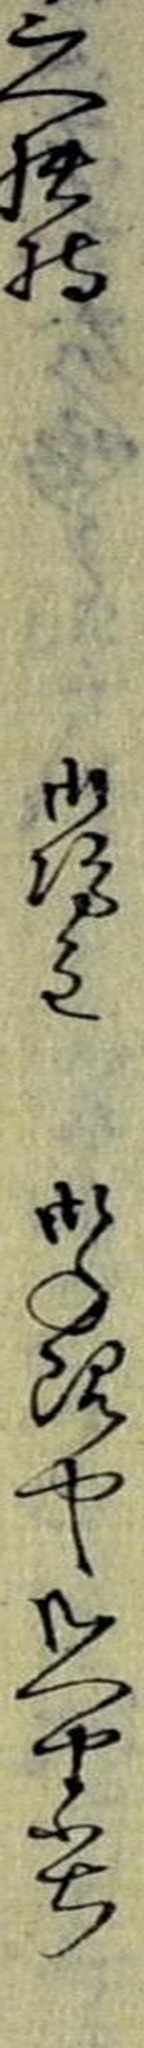三人扶持御坊主御年限中弐人半ふち
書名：命令之部 六
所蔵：福井県文書館 Fukui Prefectural Archives
